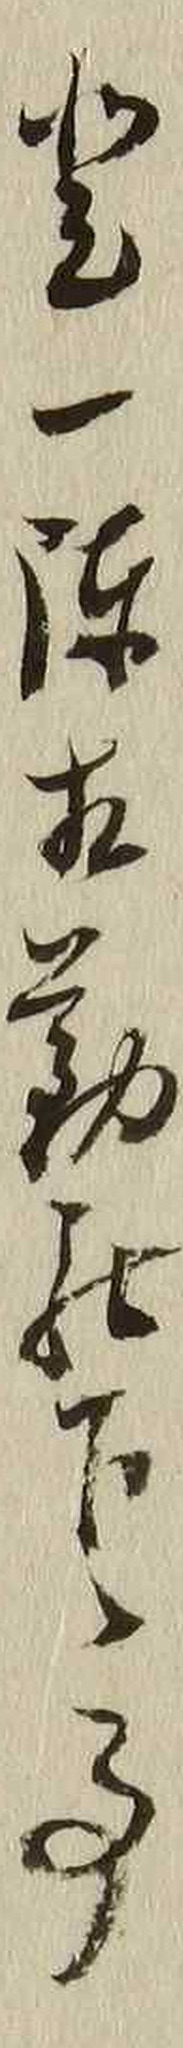登一陣相勤罷下候事
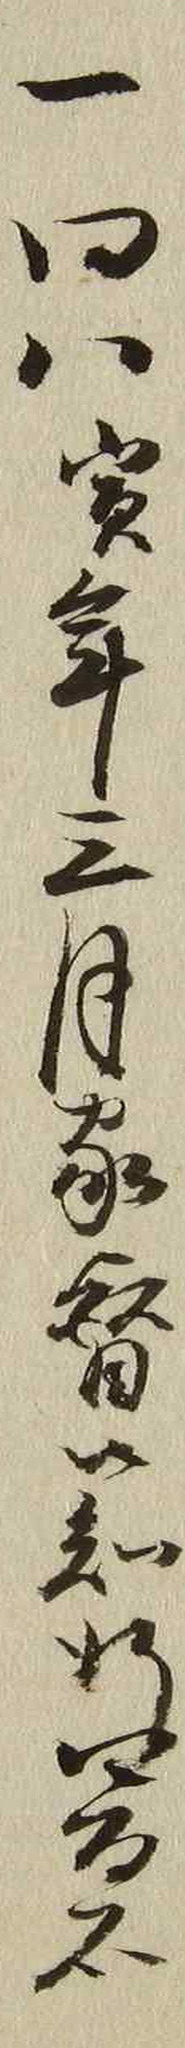一同八寅年三月家督御知行四百石
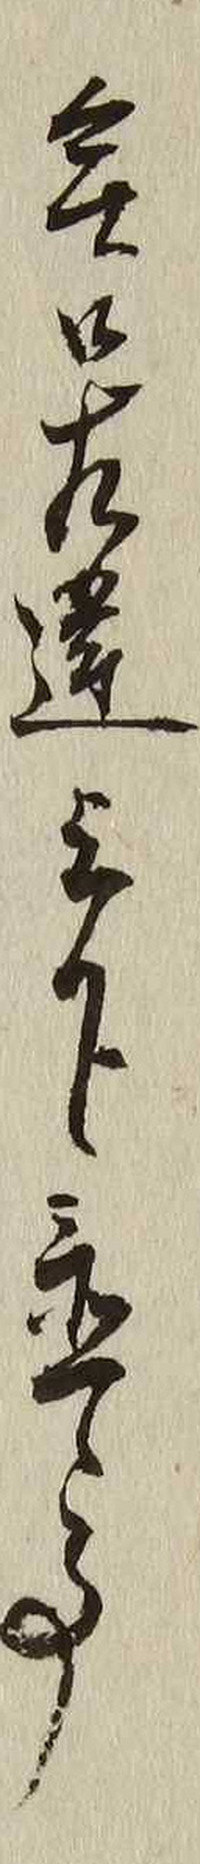無御相違被下置候事
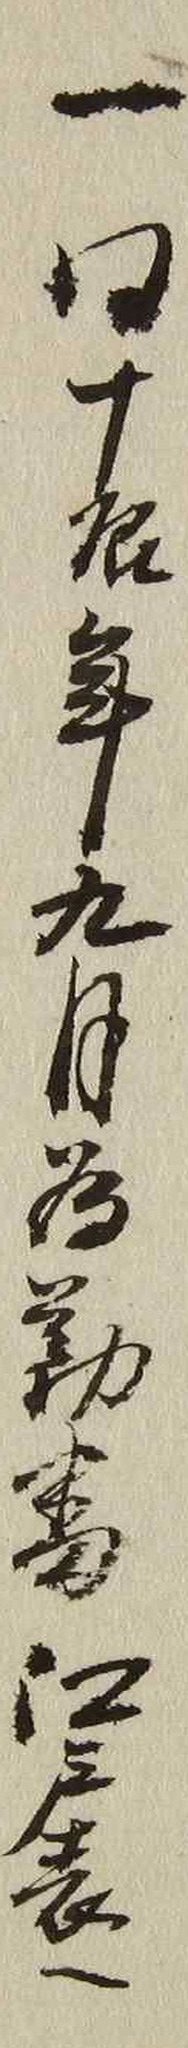一同十辰年九月為勤番江戸表へ
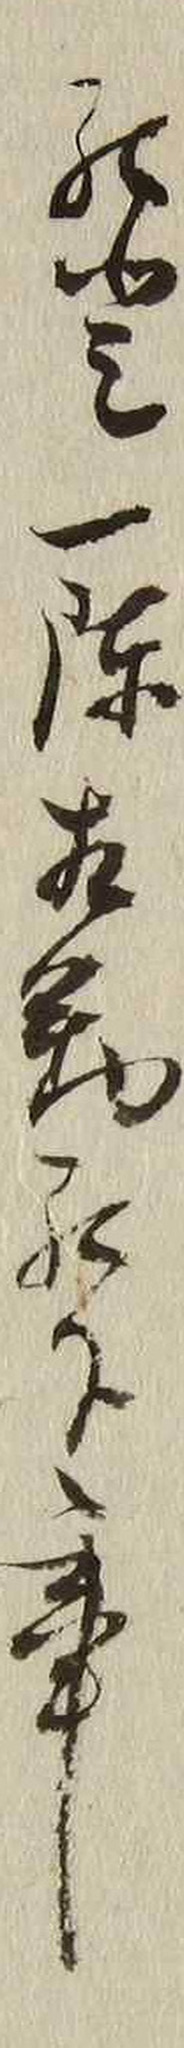罷登一陣相勤罷下候事
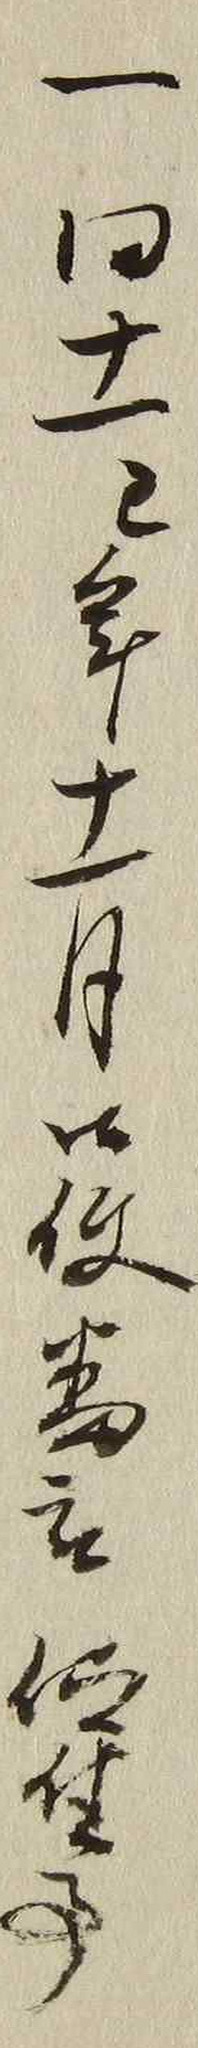一同十一巳年十一月御使番被仰付候事
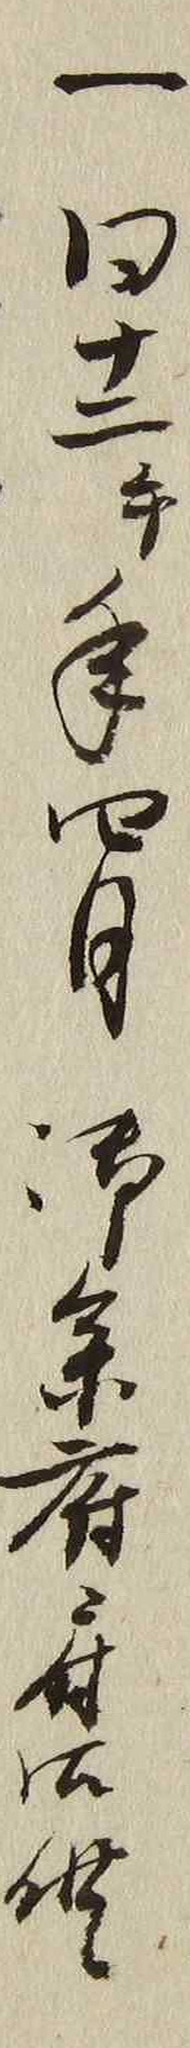一同十二午年四月御参府ニ付御供
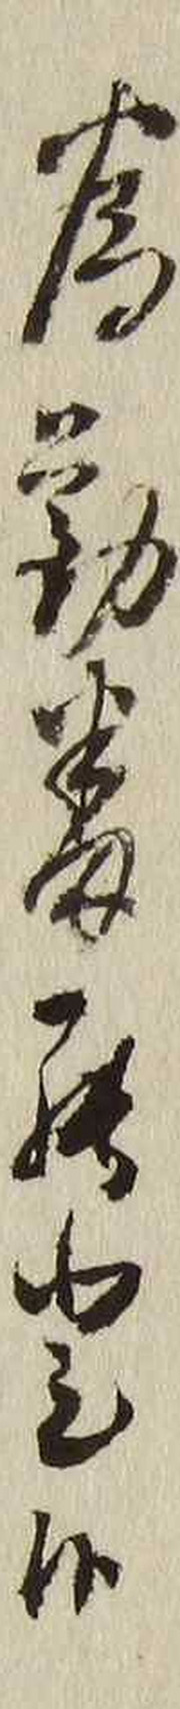為勤番罷登候
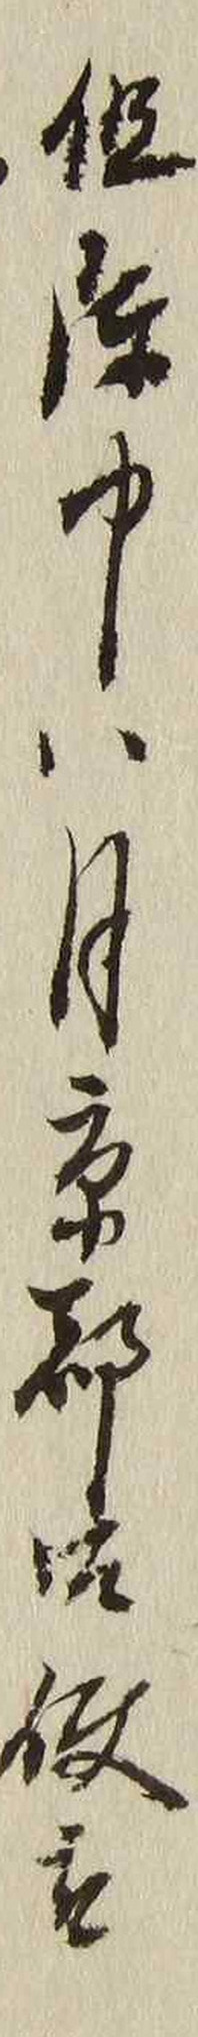但陣中八月京都御使被
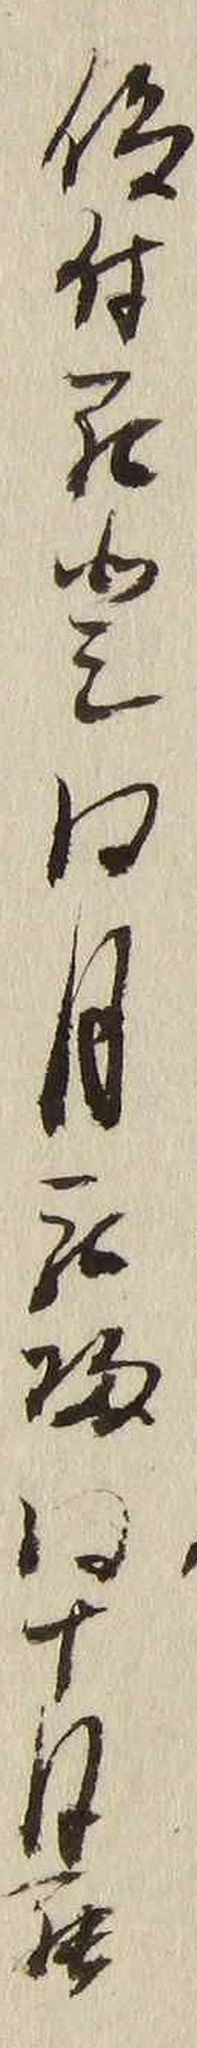仰付罷登同月罷帰同十月罷
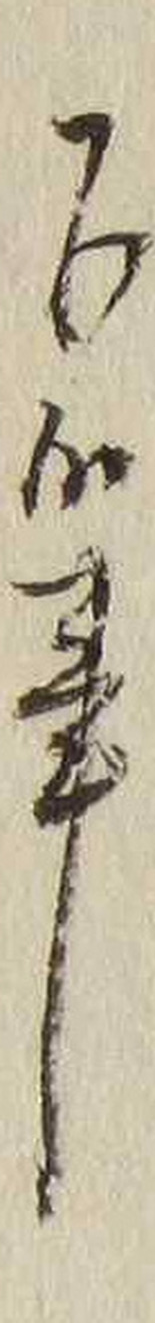下候事
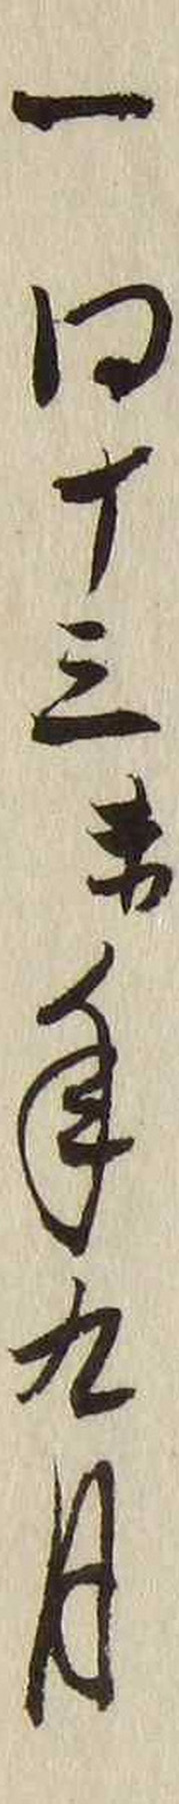一同十三未年九月

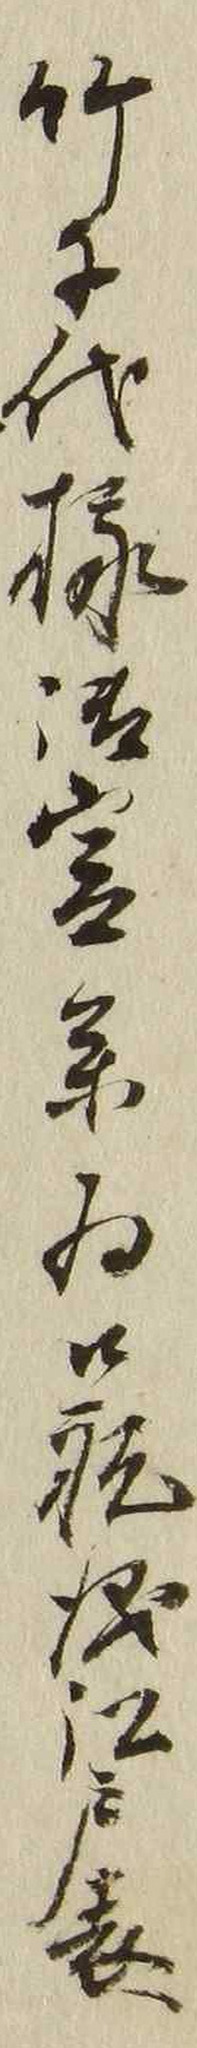竹子代様御宮参為御祝儀江戸表へ
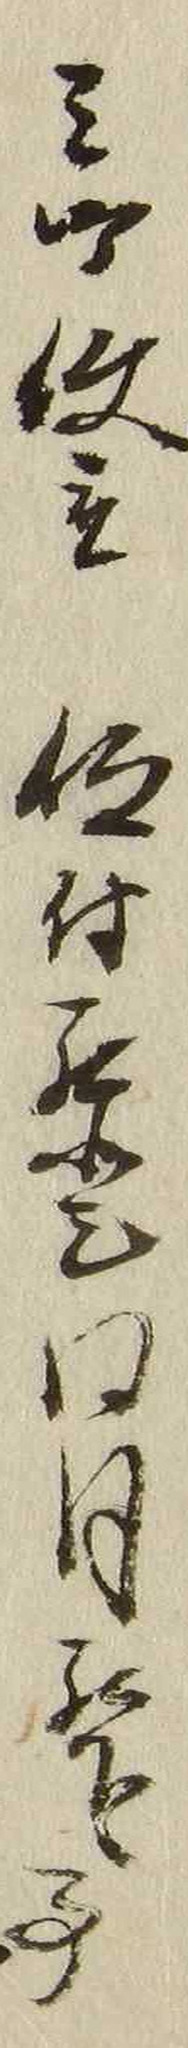之御使被仰付罷登同月罷下候事
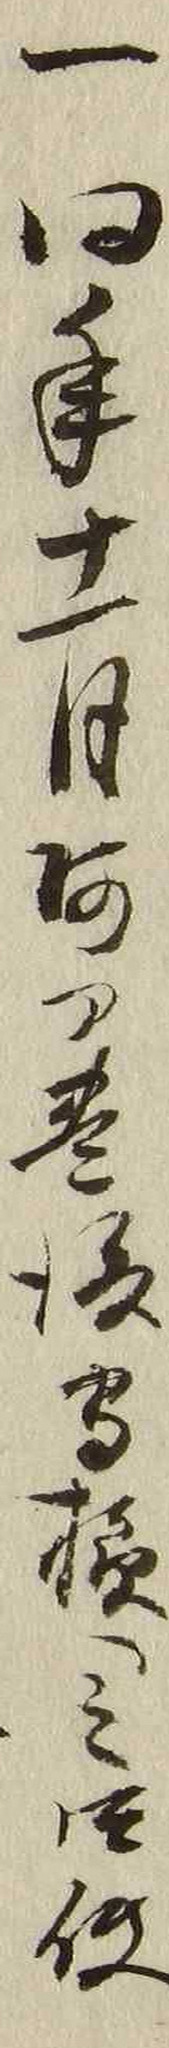一同年十一月阿部豊後守様へ之御使
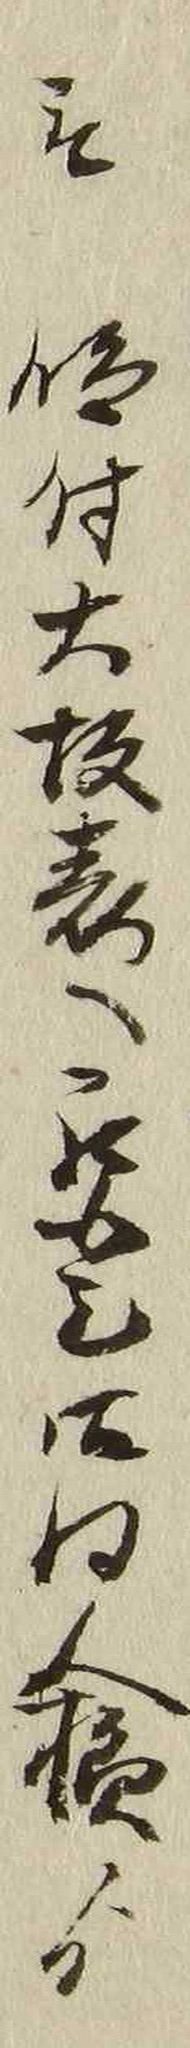被仰付大坂表へ罷登御同人様ゟ
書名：諸士系譜　巻之348　も之部4
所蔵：会津若松市立会津図書館
